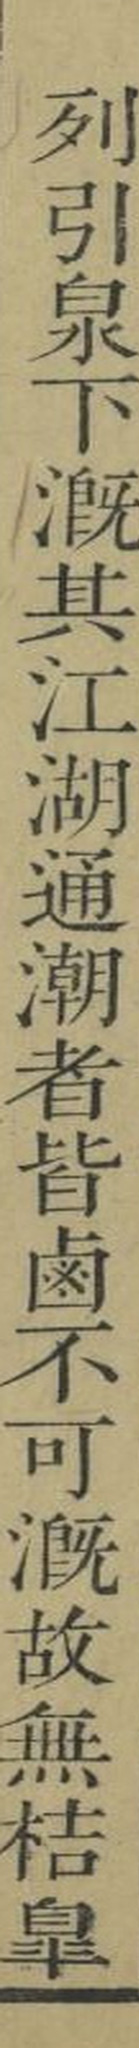列引泉下漑其江湖通潮者皆鹵不可漑故無桔皐
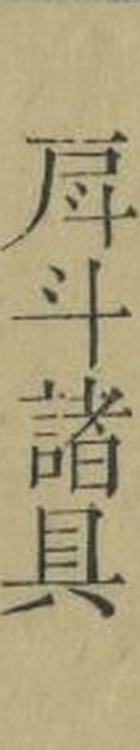戽斗諸具
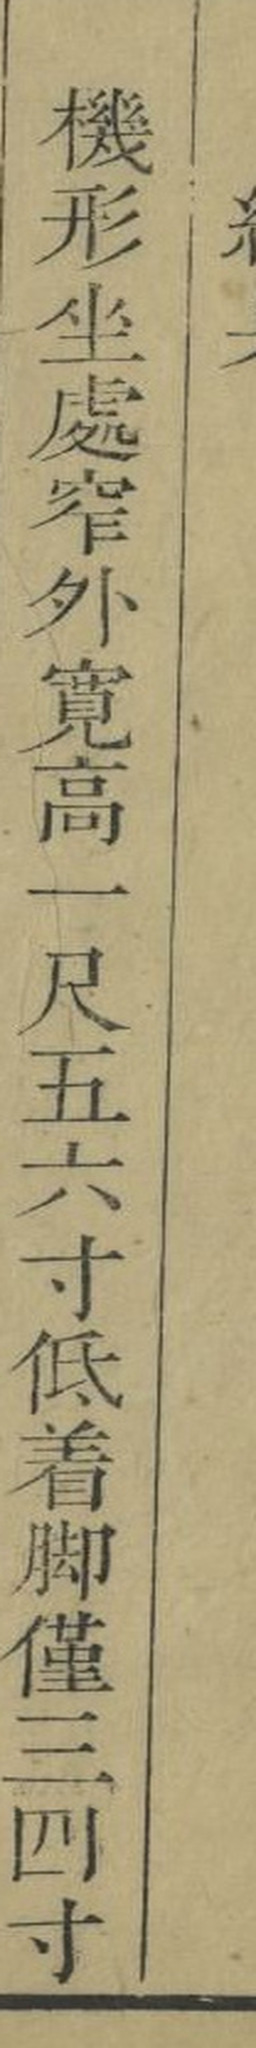機形坐処窄外寛高一尺五六寸低着脚僅三四寸
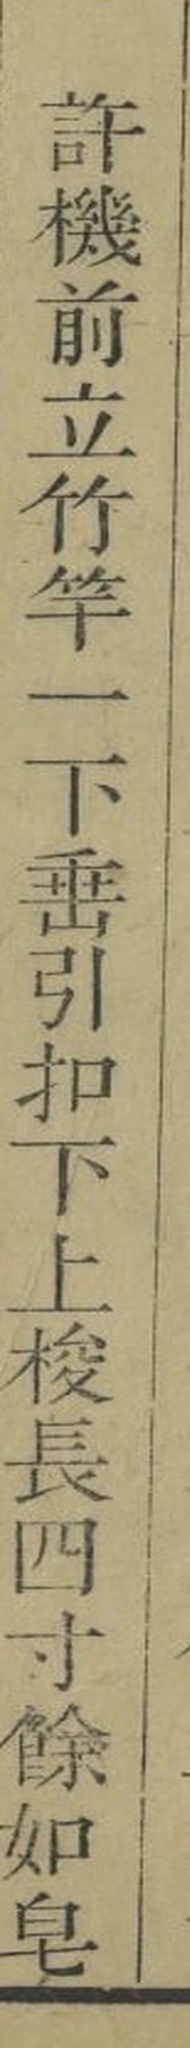許機前立竹竿一下垂引扣下上梭長四寸余如皂
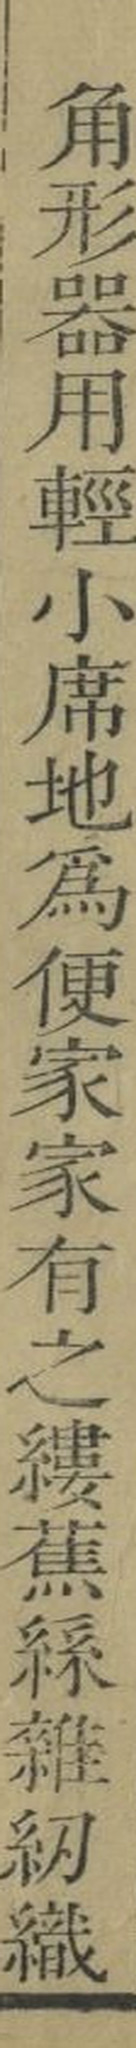角形器用軽小席地為便家家有之縷蕉糸雑紉織

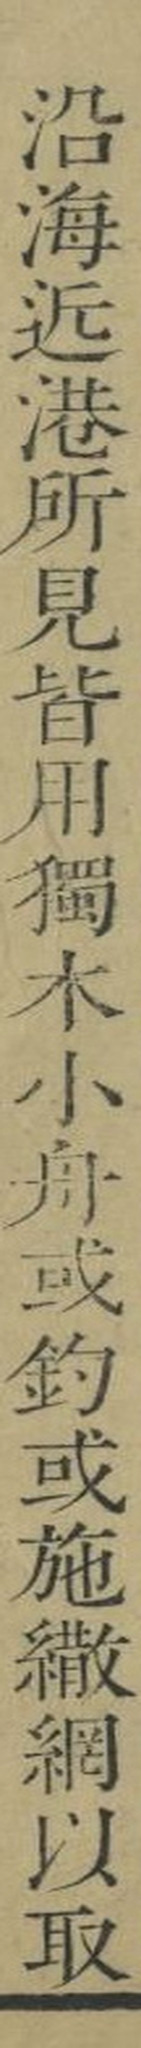沿海近港所見皆用独木小舟或釣或施繖網以取
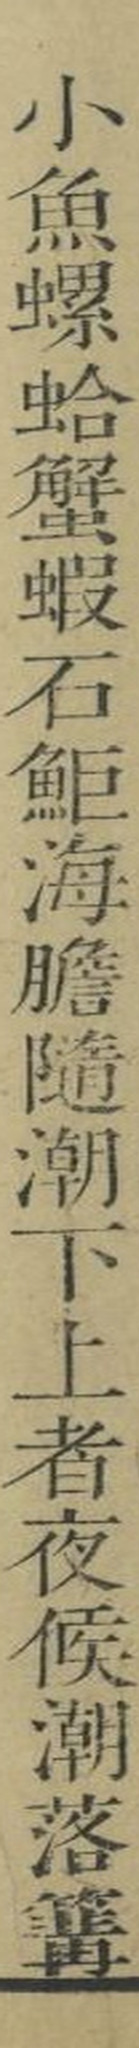小魚螺蛤蟹蝦石鮔海胆随潮下上者夜候潮落篝
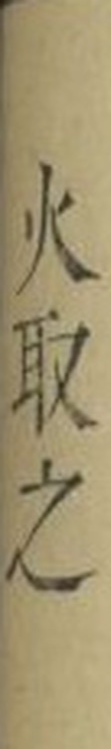火取之
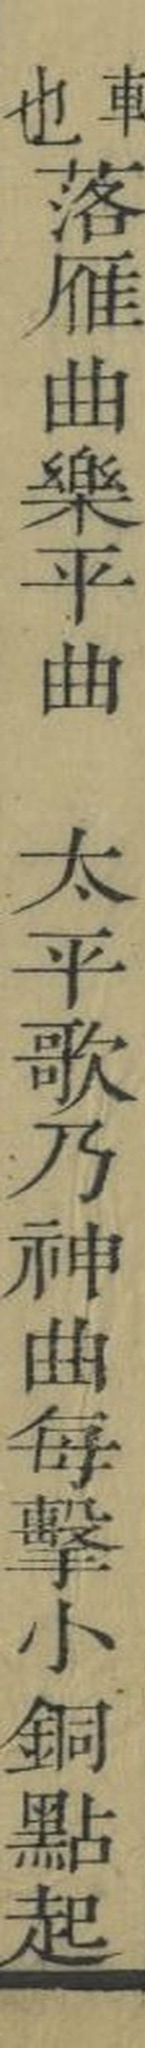転也落雁曲楽平曲太平歌乃神曲毎撃小銅点起
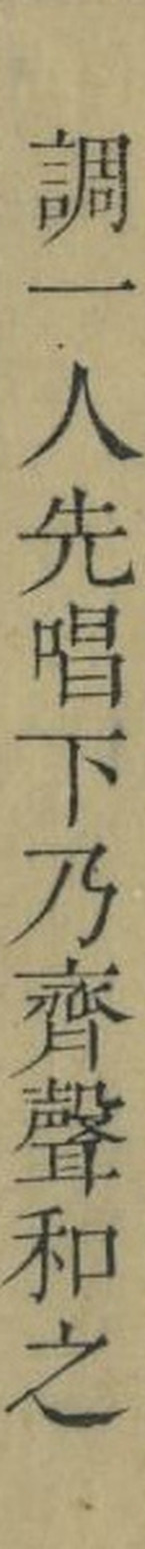調一人先唱下乃斉声和之
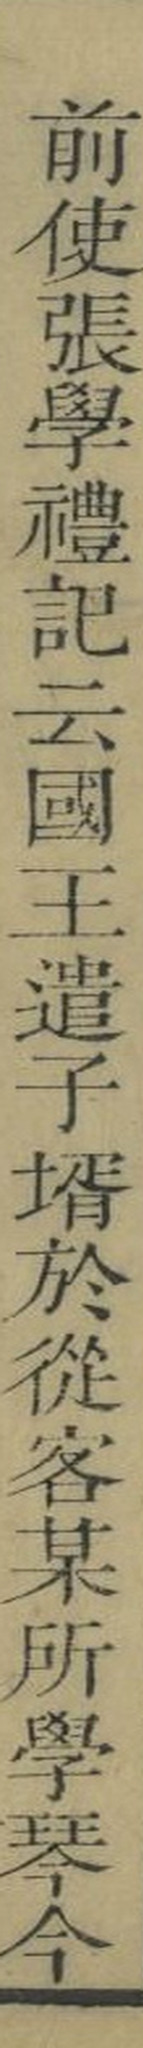前使張学礼記云国王遣子婿於従客某所学琴今
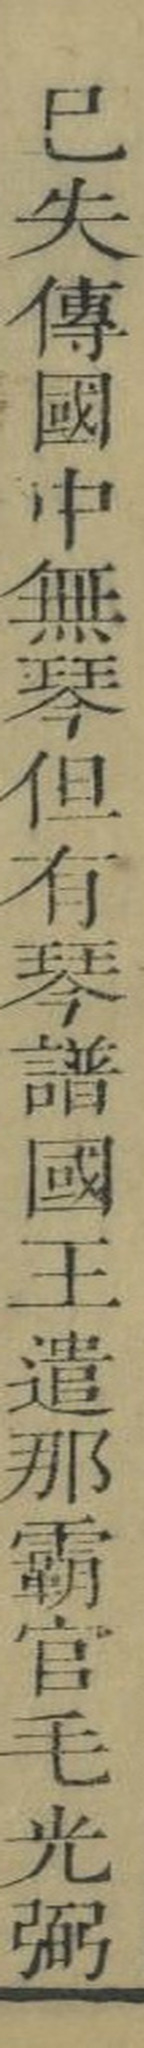巳失伝国中無琴但有琴譜国王遣那霸官毛光弼
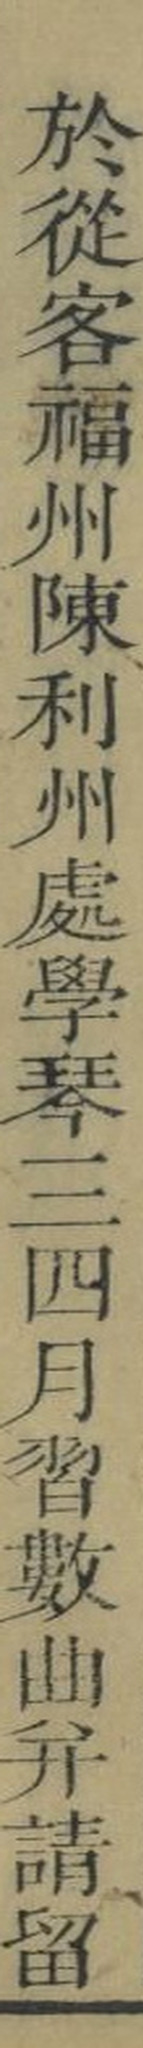於従客福州陳利州処学琴三四月習数曲幷請留
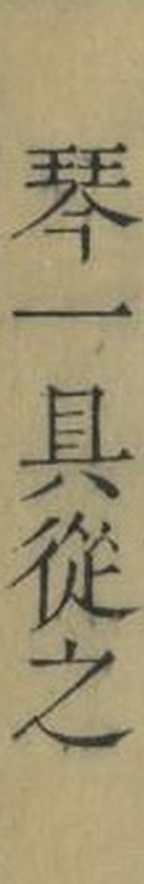琴一具従之

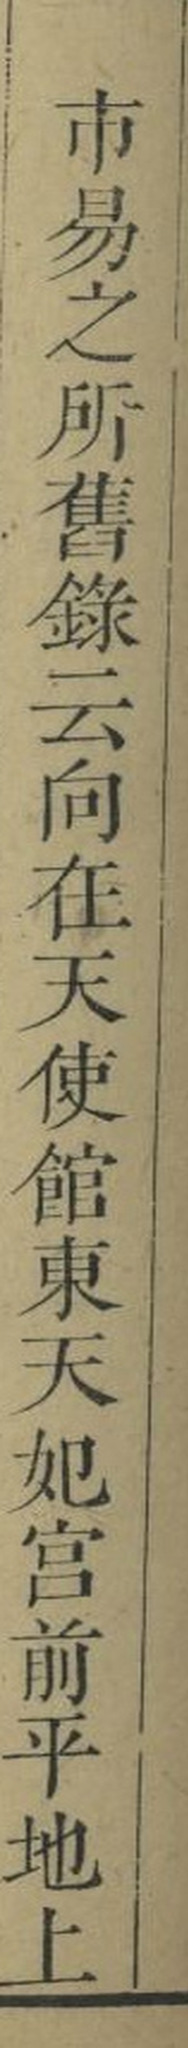市易之所旧録云向在天使館東天妃宮前平地上
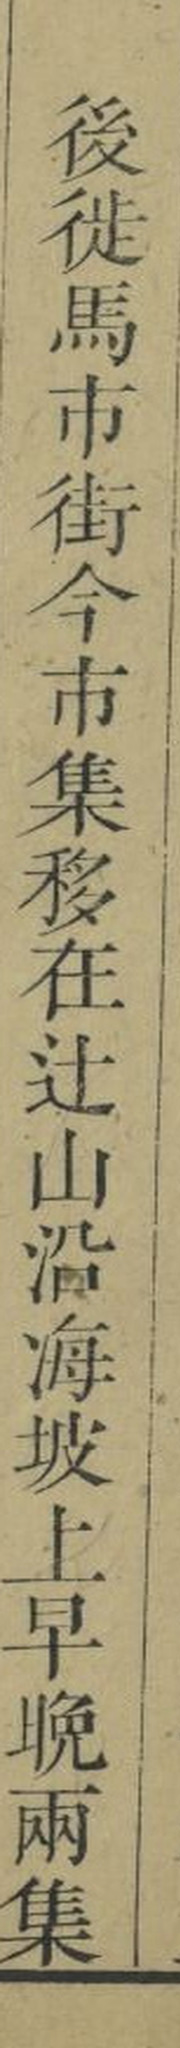後徙馬市街今市集移在辻山沿海坡上早晩両集
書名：中山伝信録 巻六
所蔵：University of the Ryukyus Library
